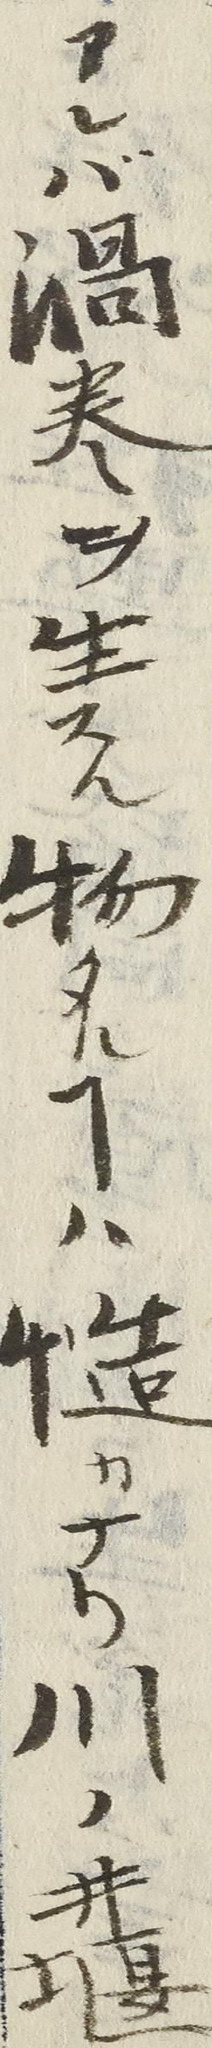アレバ渦巻ヲ生スル物タルコトハ慥リナリ川ノ井堰
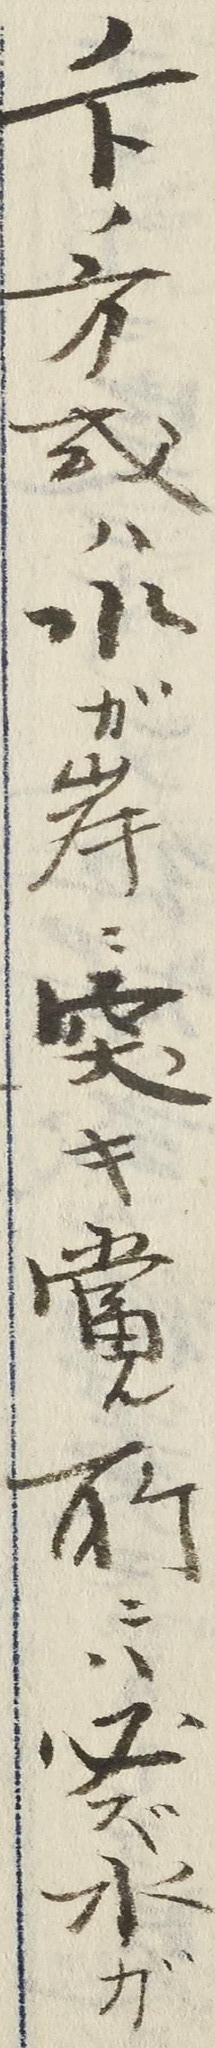ノ下ノ方或ハ水が岸に突キ当ㇽ所二ハ必ズ水が
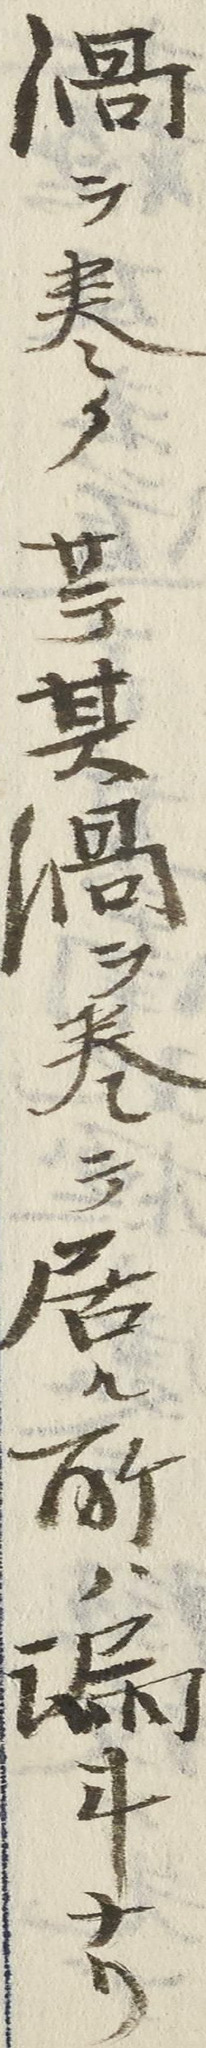渦ヲ巻クサテ其渦ヲ巻テ居ㇽ所ハ漏斗ナリ
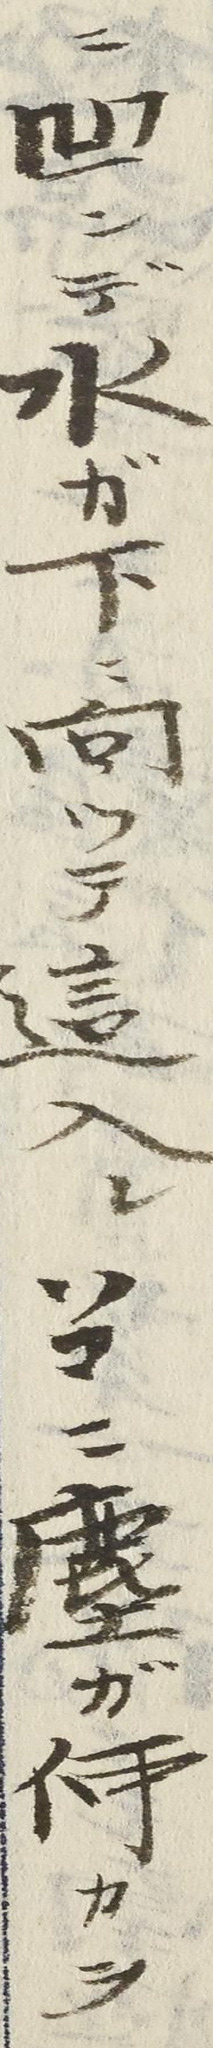二凹ンデ水が下二向ツテ這入レソコニ塵が何カヲ
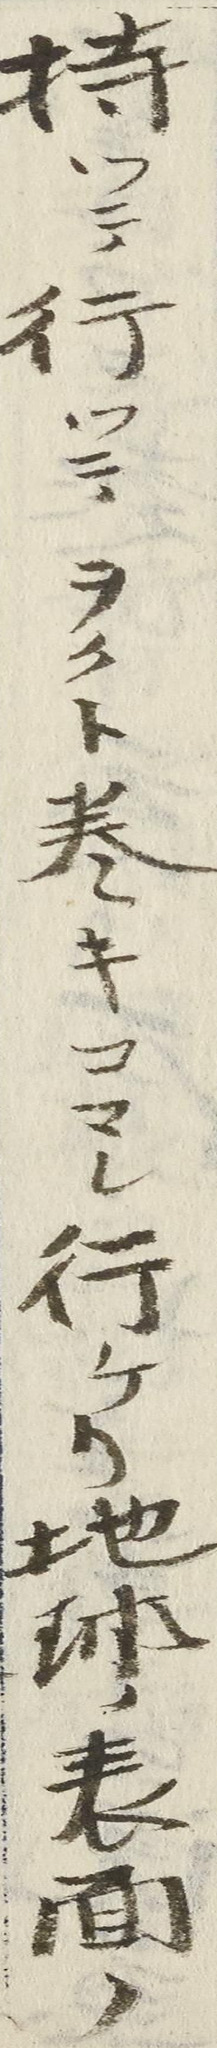持ツテ行ツテヲクト巻キコマレ行ケリ地球ノ表面ノ
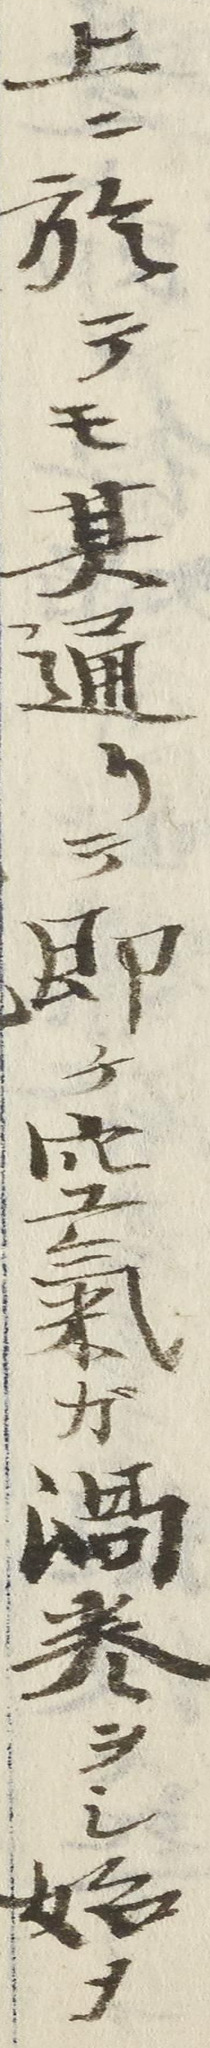上二於テモ其通リテ即チ空気ガ渦巻ヲシ始メ
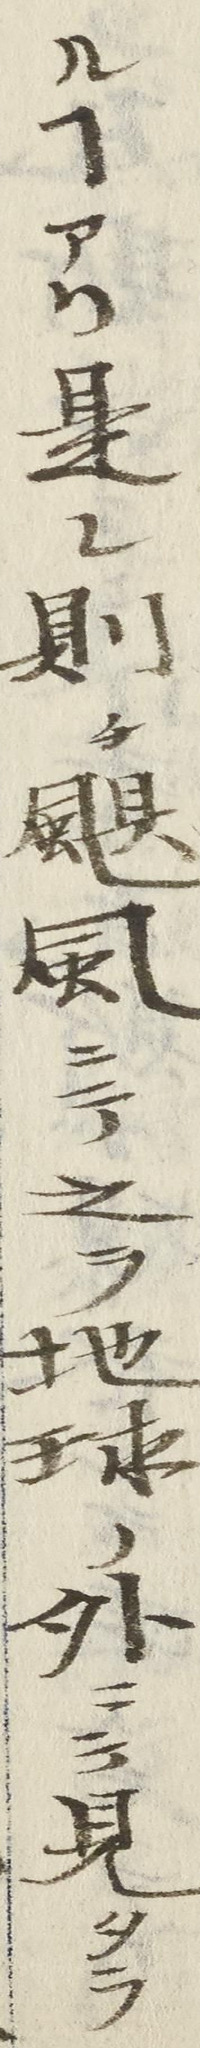ㇽコトアリ是レ則チ颶風ニテ之ヲ地球ノ外二テ見タラ
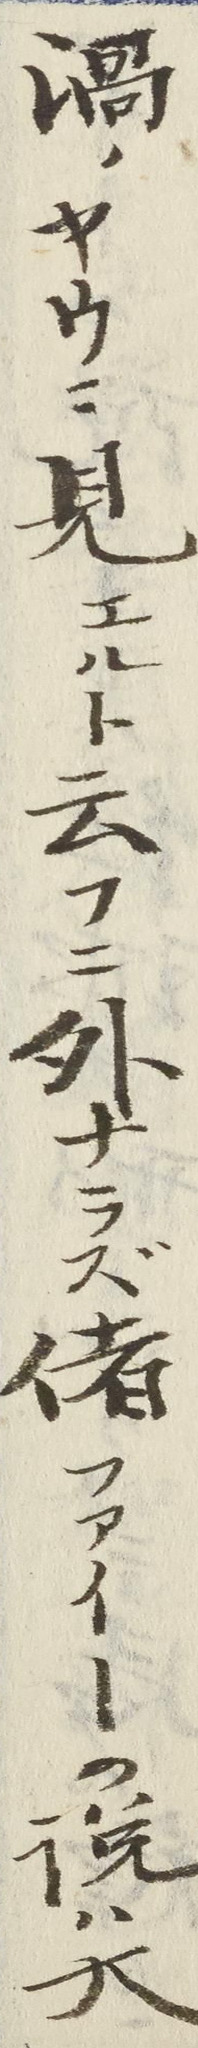渦ノヤウ二見エルト云フニ外ナラズ偖フアイ―ノ説ハ太
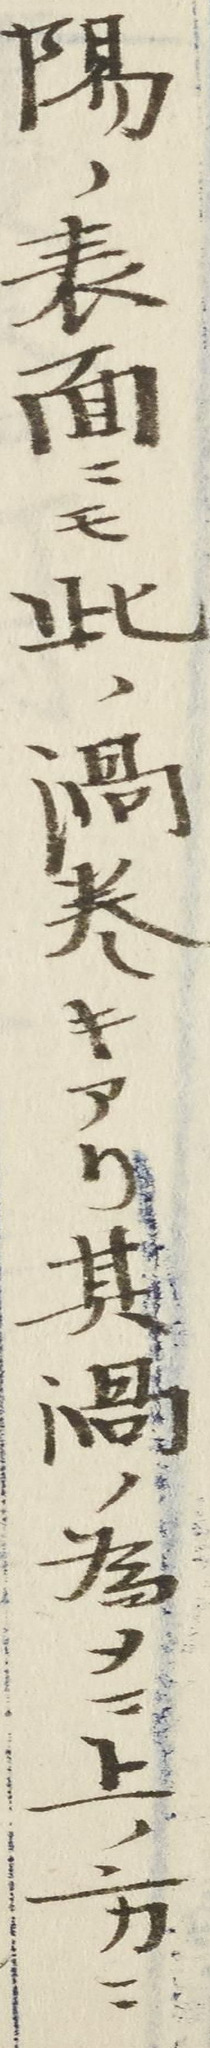陽ノ表面二モ此ノ渦巻キアリ其渦ノ為メ二上ノ方二
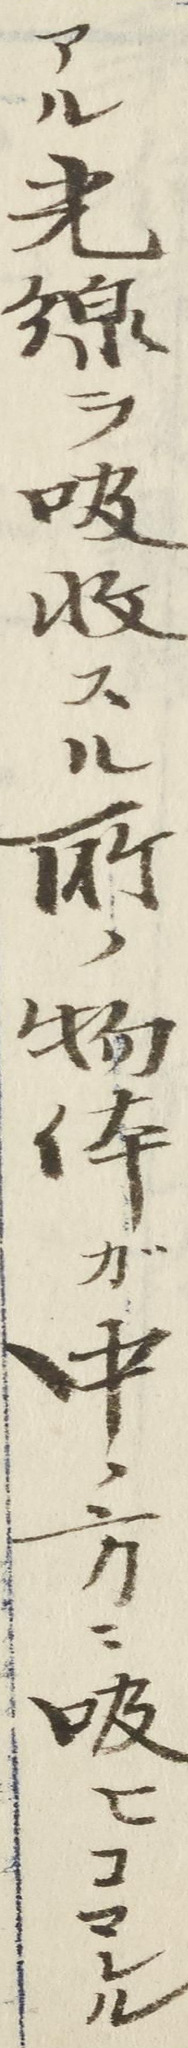アル光線ヲ吸収スル所ノ物体が中ノ方二吸ヒコマレル
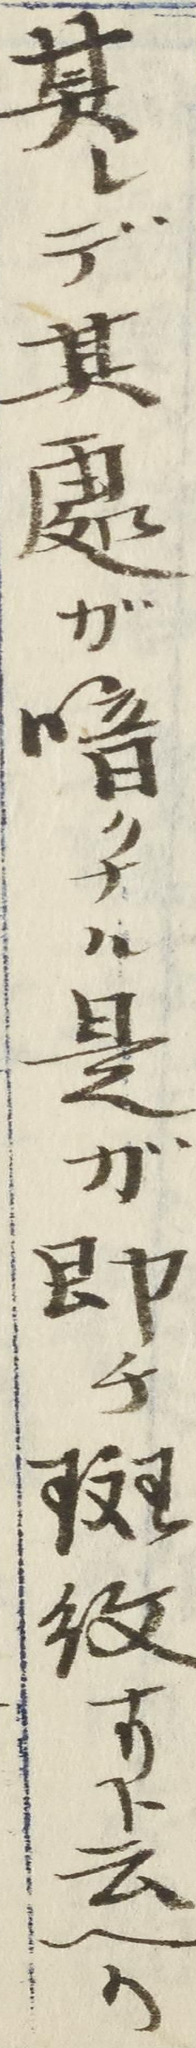其レデ其処ガ暗クナル是が即チ斑紋ナリ斗云ヘリ
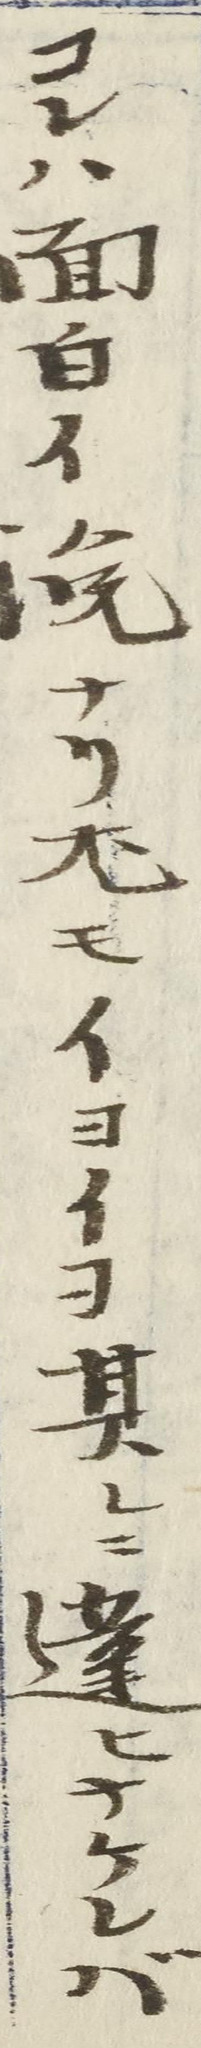コレハ面白イ説ナリ尤モイヨイヨ其レ二違ヒナケレバ
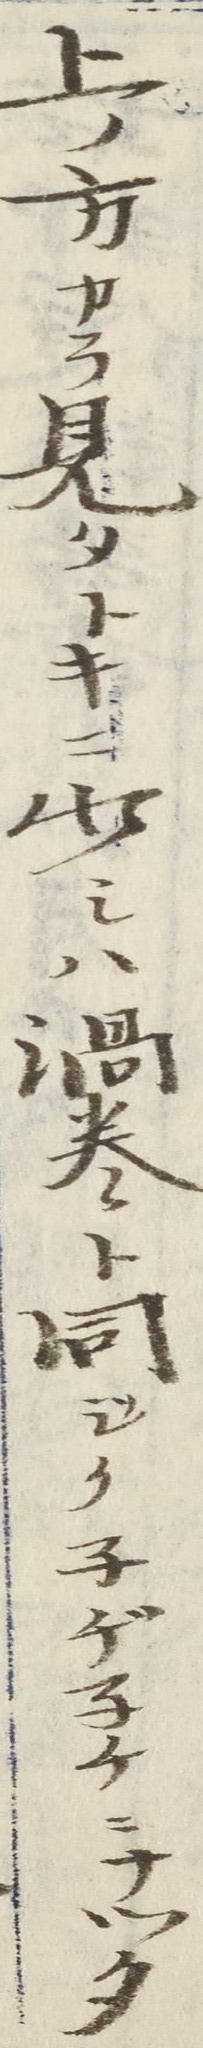上ノ方カラ見タトキ二少シハ渦巻ㇳ同ジク子ゲ子ゲ二ナツタ
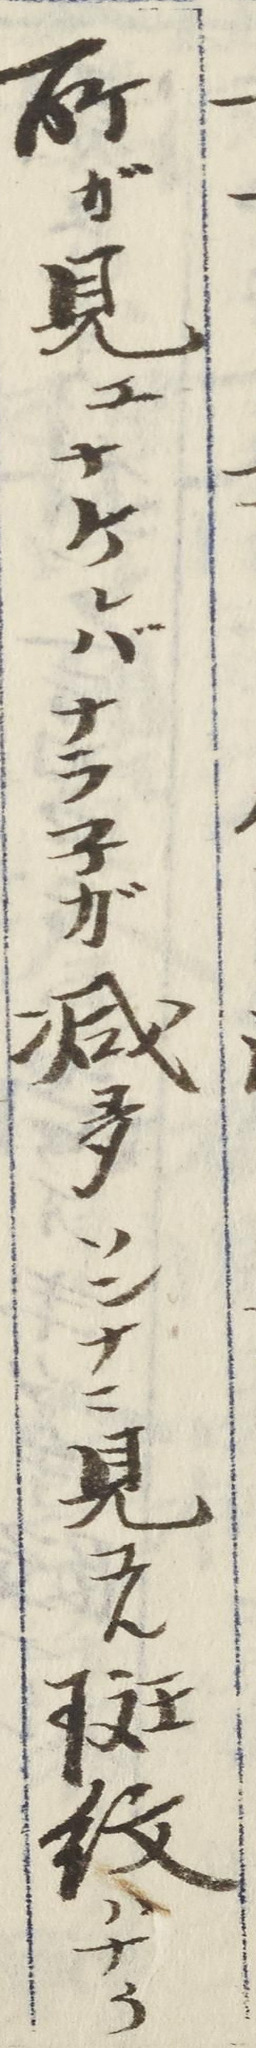所が見エナケレバナラ子が滅多ソンナニ見エン斑紋ハナク
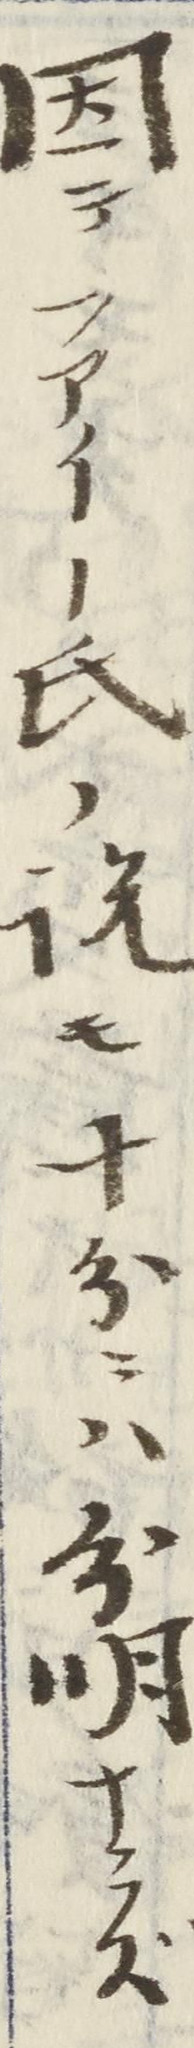因テフアイー氏ノ説モ十分ニハ分明ナラズ
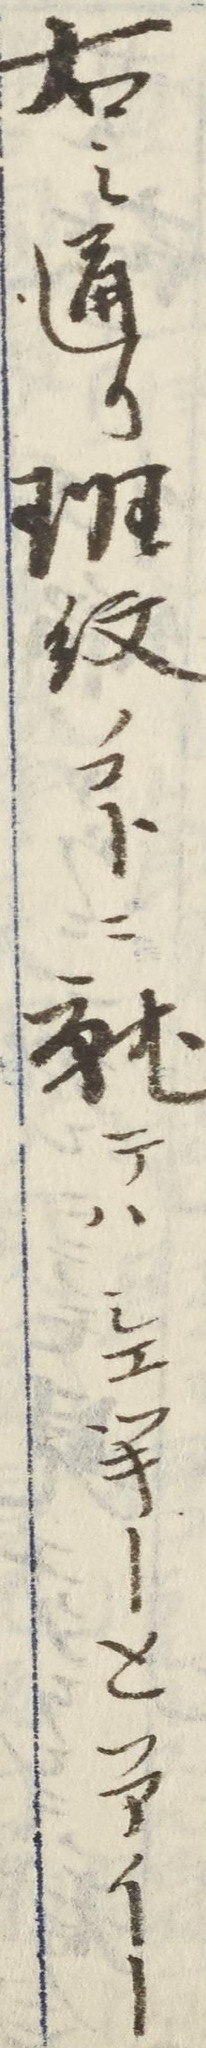右之通り斑紋ノコトニ就テハシエツキーとフアイー
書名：日蝕録　全
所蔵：東京大学地震研究所図書室 Earthquake Research Institute Library, The University of Tokyo, JAPAN
